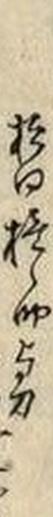杉田権之助与力
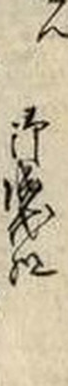御城代組
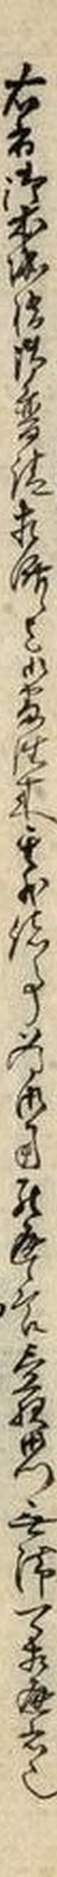右者御本城御普請相済候迄御番往来其外諸事為御用罷通候節昼夜御門無滞可相通者也
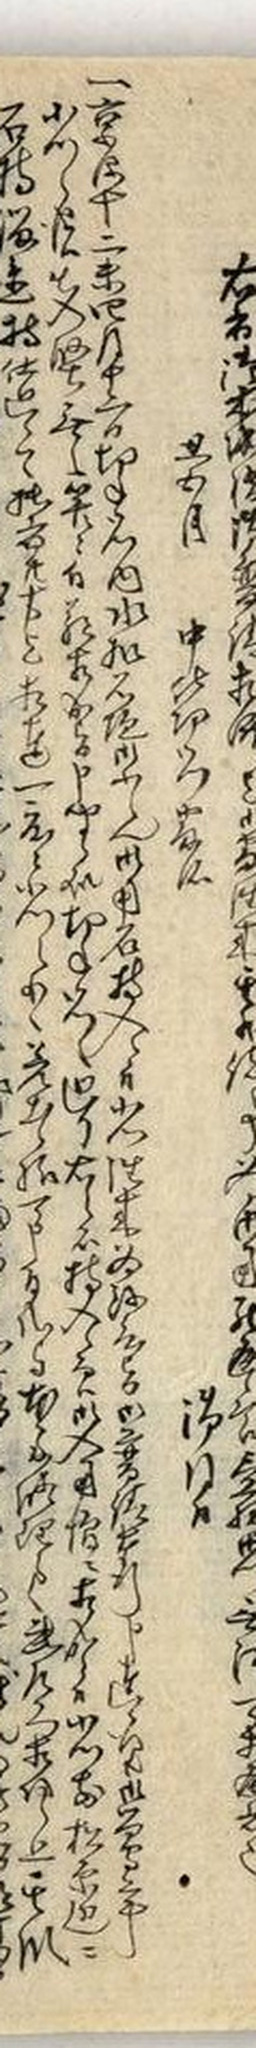一享保十二未四月十二日切手御門内水扣石垣御ふしん御用石持入候に付小門往来為致度旨御普請奉行申達候得共御留守中
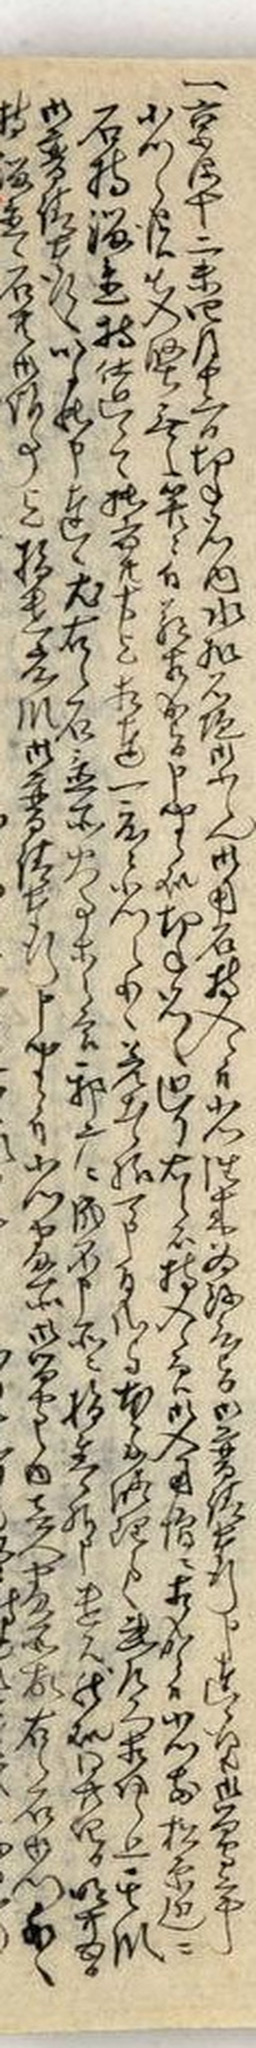石持溜置持仕廻候はゝ拙者共方迄相達一度に小門之外へ差出候様可申付哉と本多修理方へ武左衛門相伺候上其段
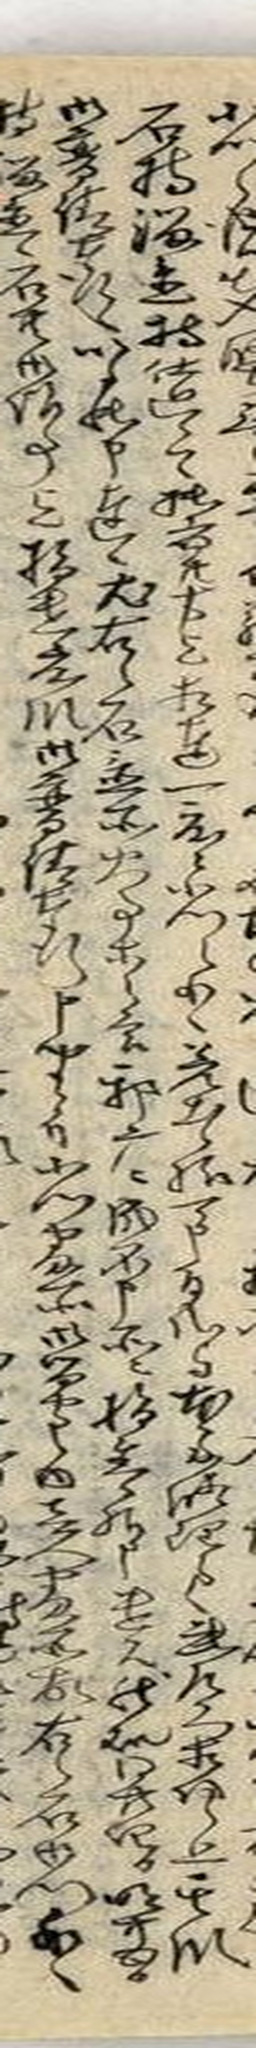持溜置候石共御作事迄指遣度段御普請奉行申聞候付小門番所御留守之内壱人番所故右之石御門外へ
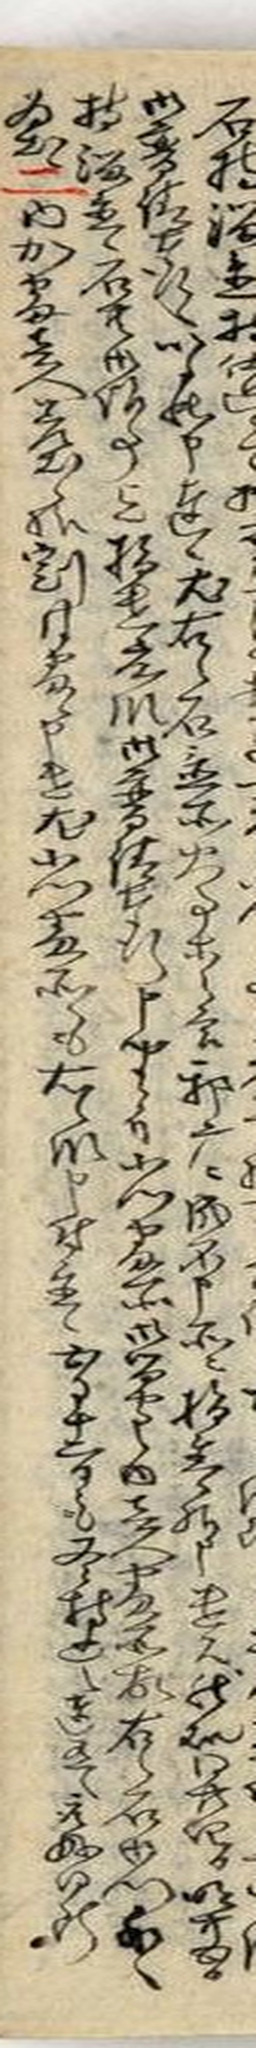為出候内加番壱人差出候様割月番へ申遣尤小門番所へも右之段申付置候五月十二月にも又々持込之達有之取扱同断

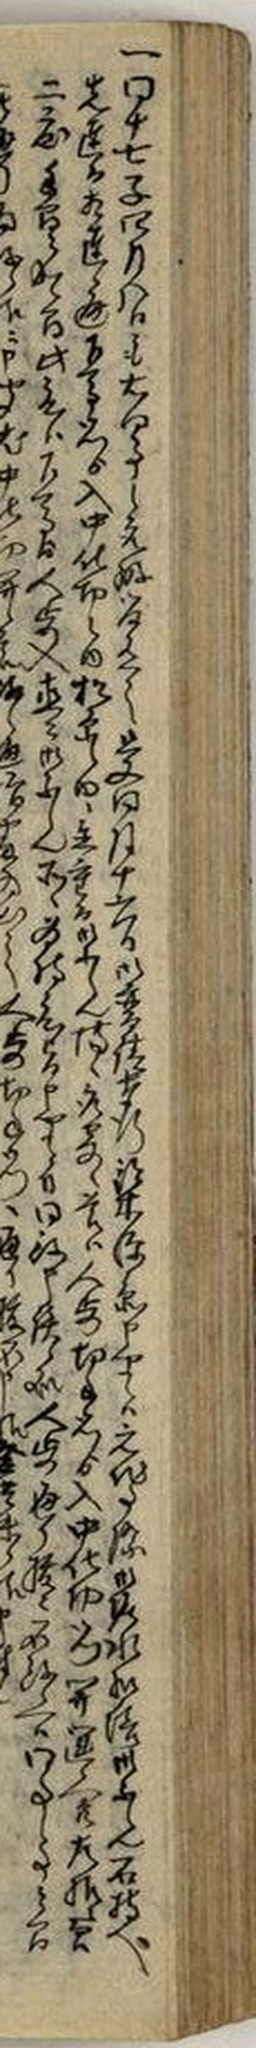一同十七子四月八日にも右同時の之取扱留有之且又同月十六日御普請奉行鈴木源兵衛申聞候は元作事際御堀水扣繕御ふしん石持人
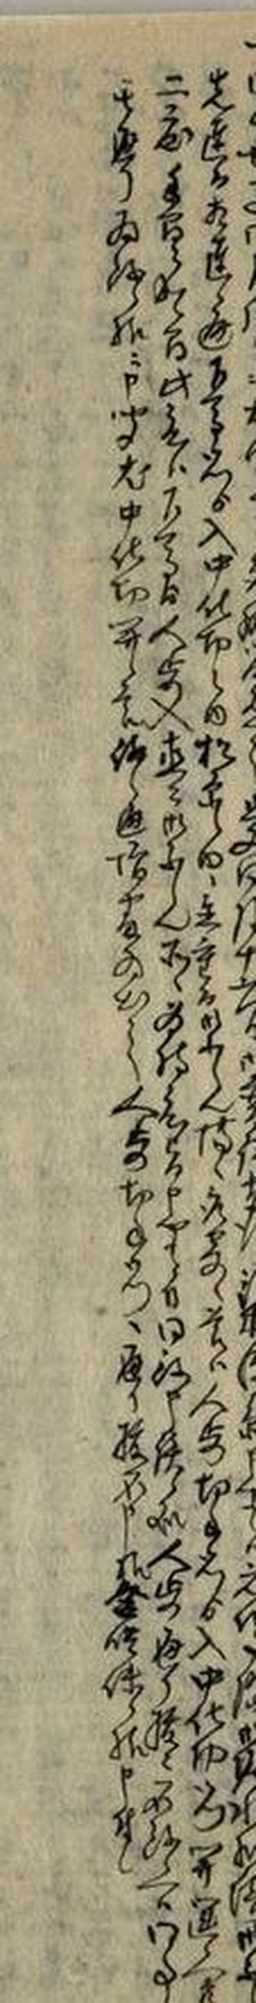其通り為致候様に申聞尤中仕切開候節例之通増番為出之人歩切手御門へ通り抜不申様令吟味候様申付候
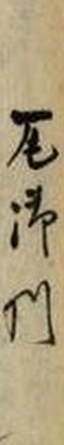瓦御門
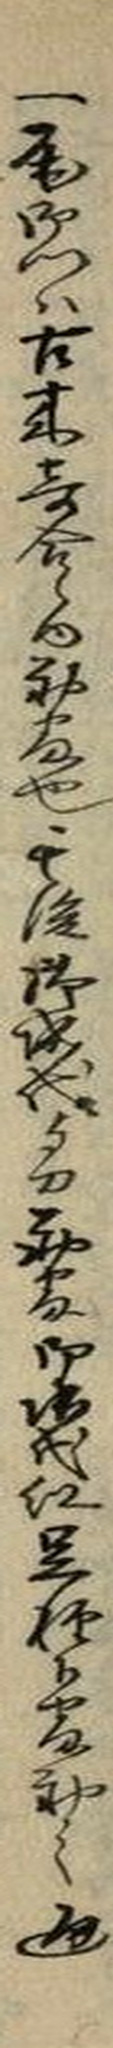一瓦御門は古来寄合之内勤番也其後御城代与力勤番御城代組足軽下番勤之通
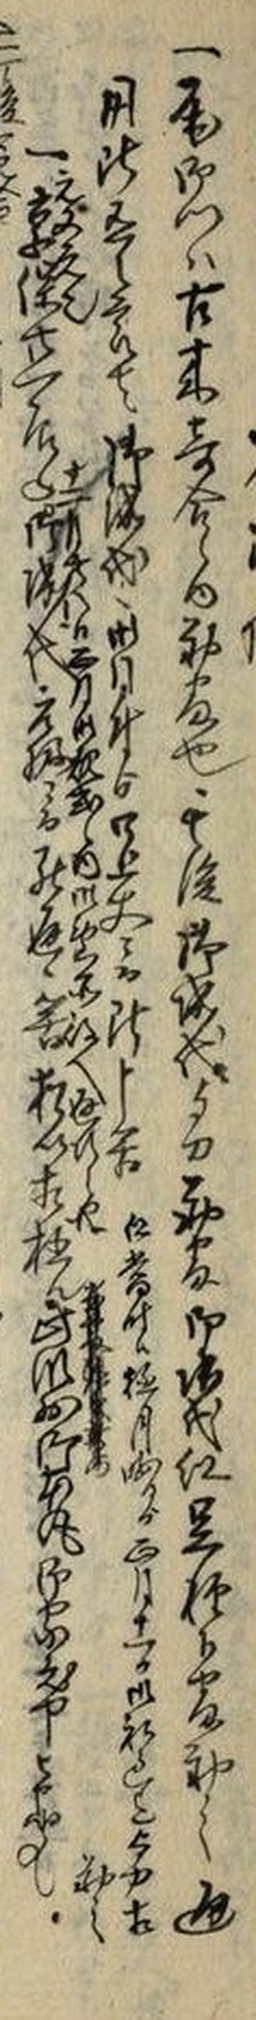用断有之節は御城代へ御目付ゟ口上使に而断申筈但当時は極月晦日ゟ正月十一日御礼過迄与力相勤之
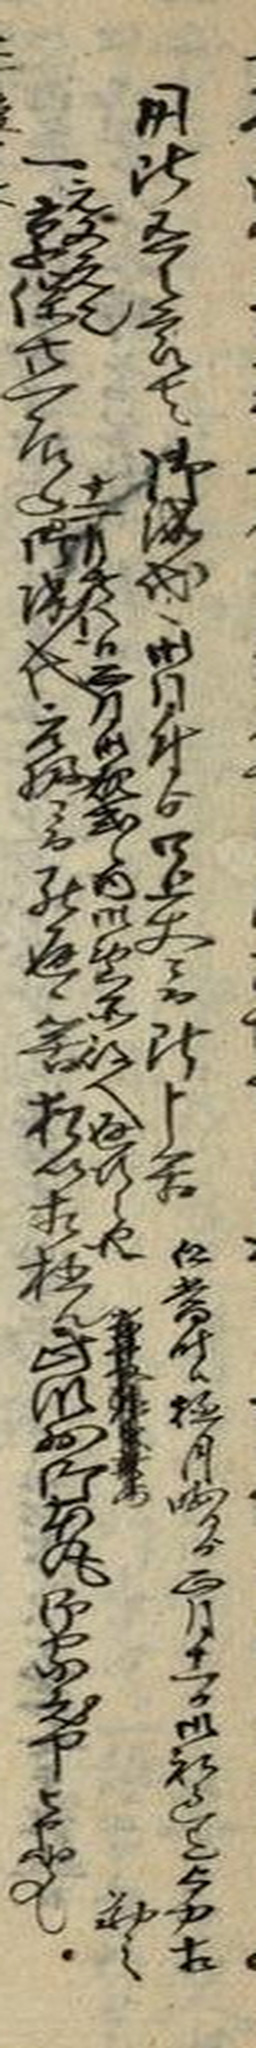一享保廿一辰年○御城代取扱に而罷通候筈猶以相極ル此段於御本丸御家老中被申聞候
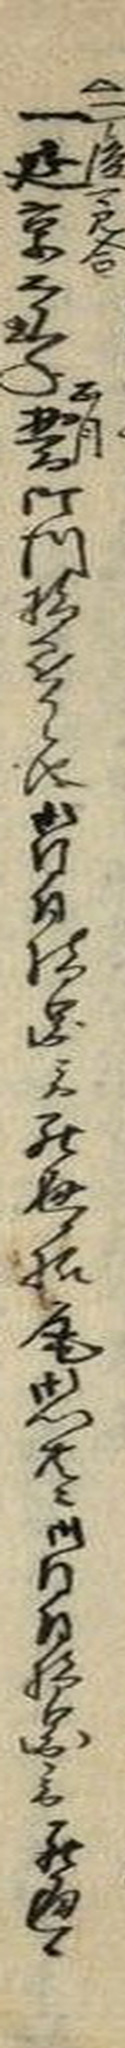一延享二丑年正月惣而御門指懸り候儀御目付指図に而罷通候様瓦御門共に御目付指図に而罷通候
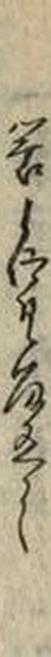筈被仰付候留有之
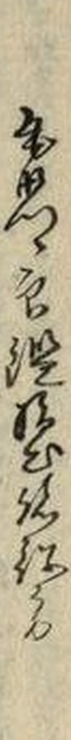瓦御門へ印鑑指出諸役方
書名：御門御櫓之部
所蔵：福井県文書館 Fukui Prefectural Archives
